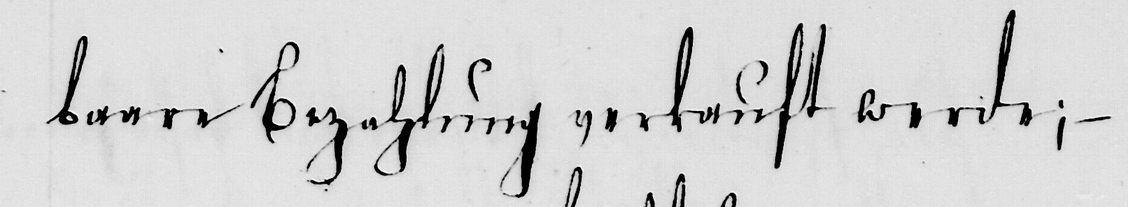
baare Bezahlung verkauft werde; –
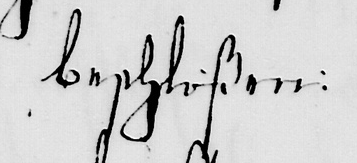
beschloßen:
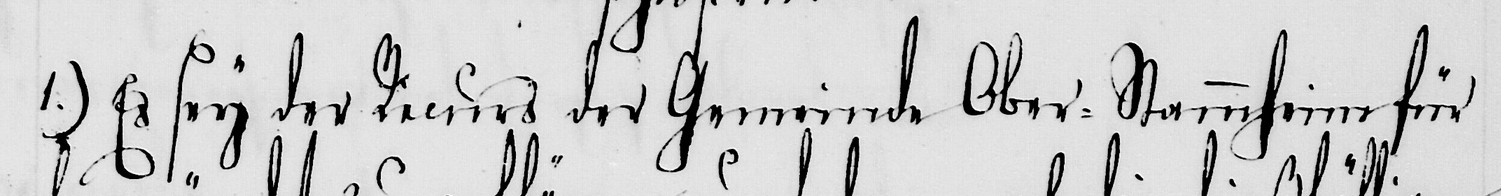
1.) Es sey der Recurs der Gemeinde Ober-Stammheim für
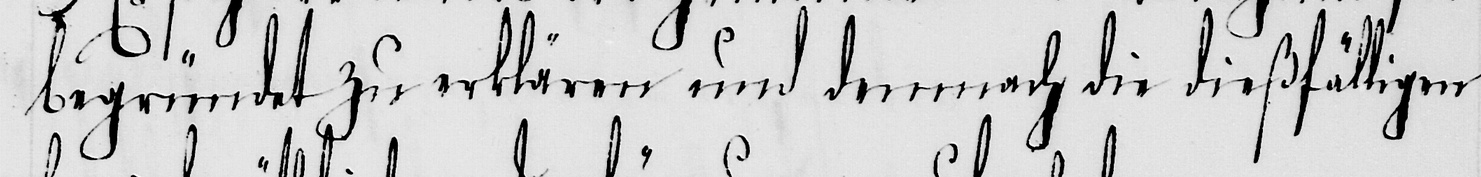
begründet zu erklären und demnach die dießfälligen
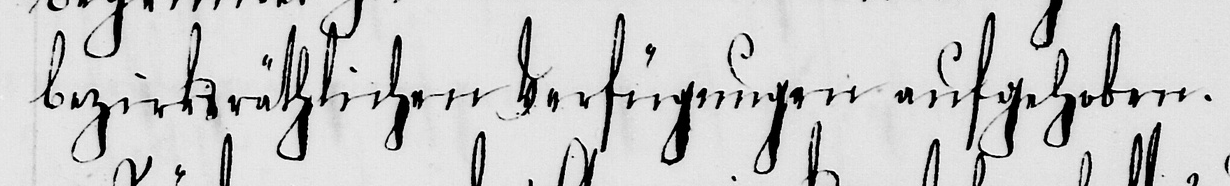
bezirksräthlichen Verfügungen aufgehoben.
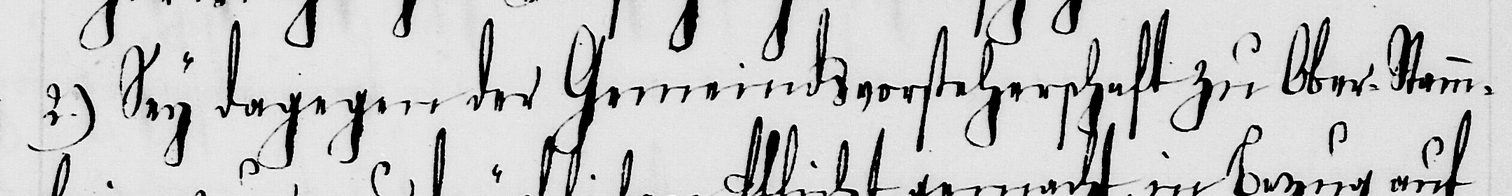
2.) Sey dagegen der Gemeindsvorsteherschaft zu Ober-Stam¬
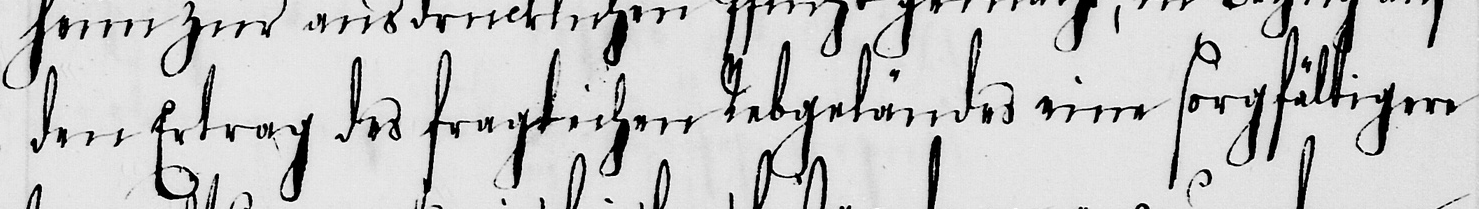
den Ertrag des fraglichen Rebgeländes eine sorgfältigere
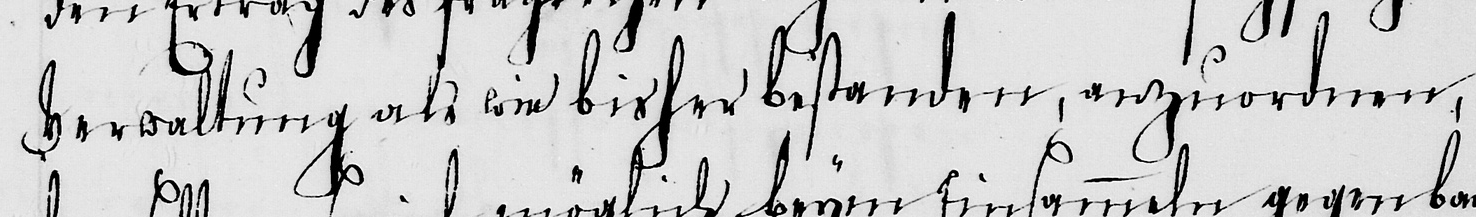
Verwaltung als wie bisher bestanden, anzuordnen,
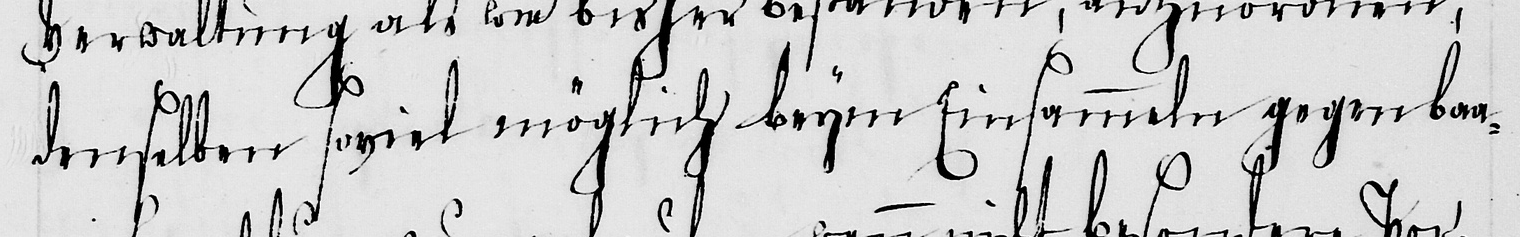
denselben soviel möglich beym Einsammeln gegen baa¬
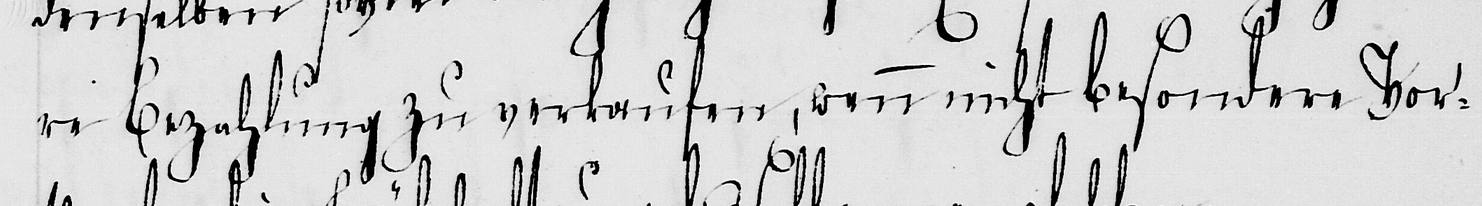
re Bezahlung zu verkaufen, wenn nicht besondere Vor¬
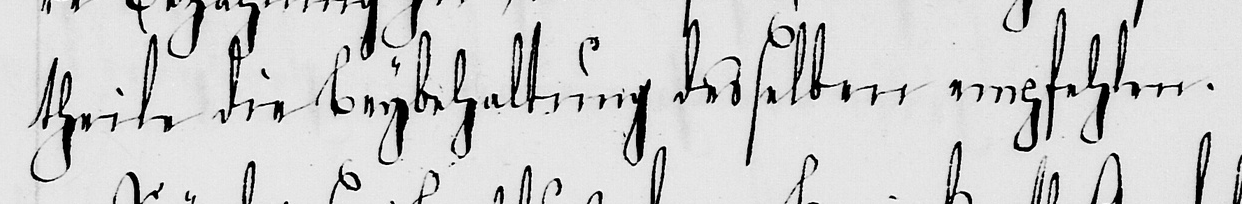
theile die Beybehaltung desselben empfehlen.
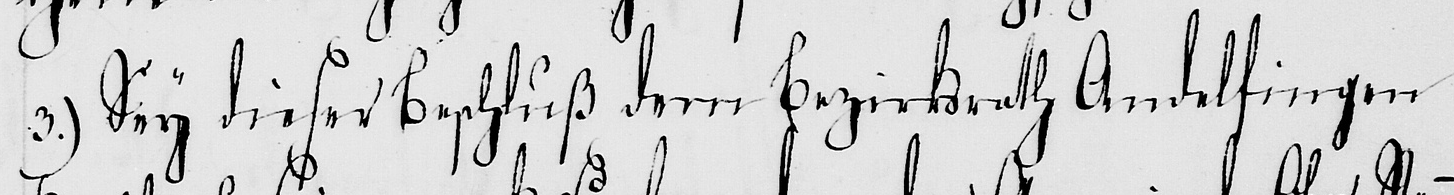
3.) Sey dieser Beschluß dem Bezirksrath Andelfingen
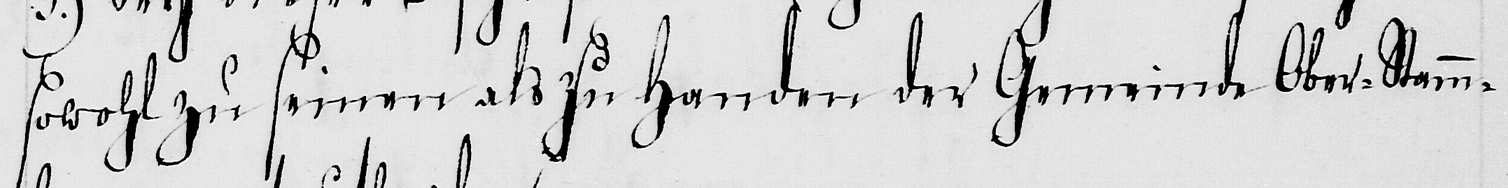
sowohl zu seinen als zu Handen der Gemeinde Ober-Stam¬
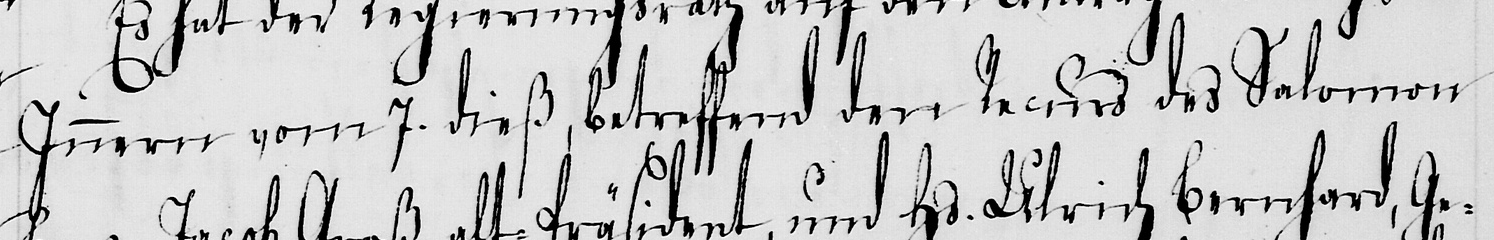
Innern vom 7. dieß, betreffend den Recurs des Salomon
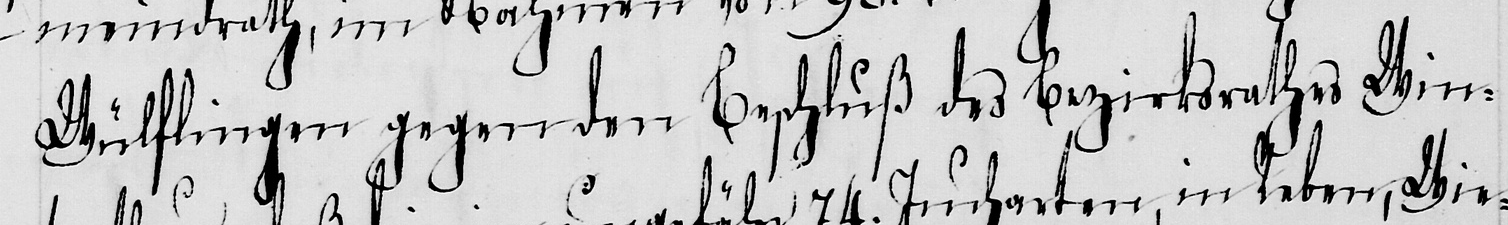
Wülflingen gegen den Beschluß des Bezirksrathes Win¬
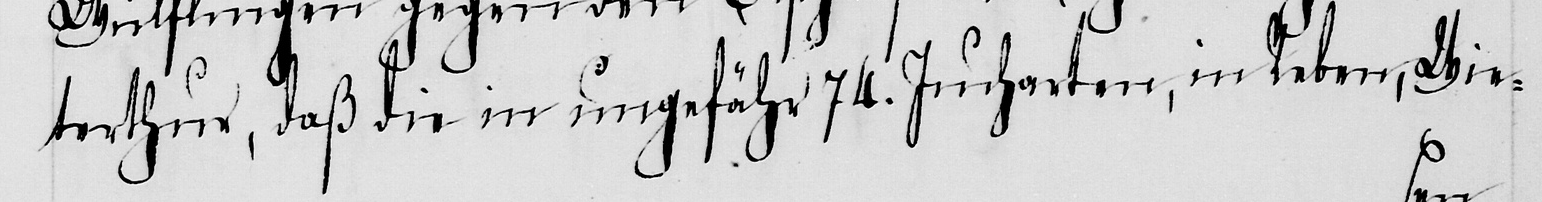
terthur, daß die in ungefähr 74. Jucharten, in Reben, Wie-
